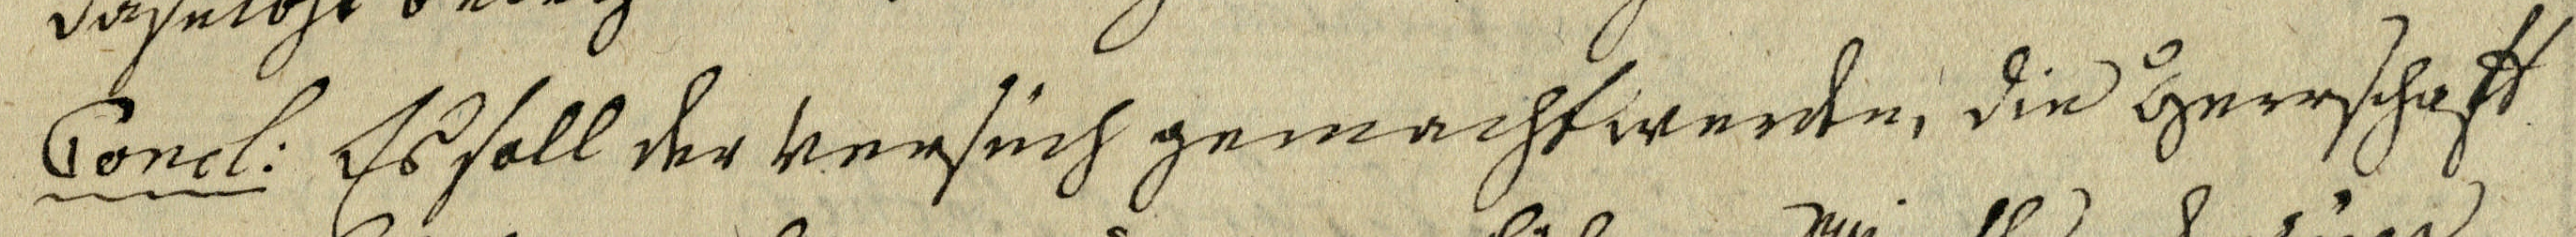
Concl. Es soll der Versuch gemacht werden, die Herrschaft
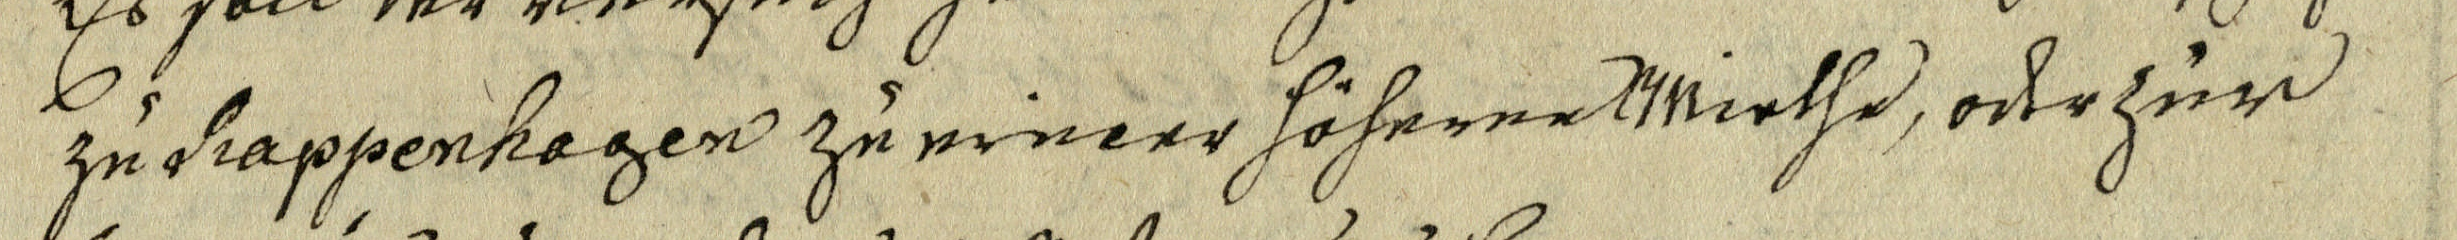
zu Rappenhagen zu einer höherne Miethe, oder zur
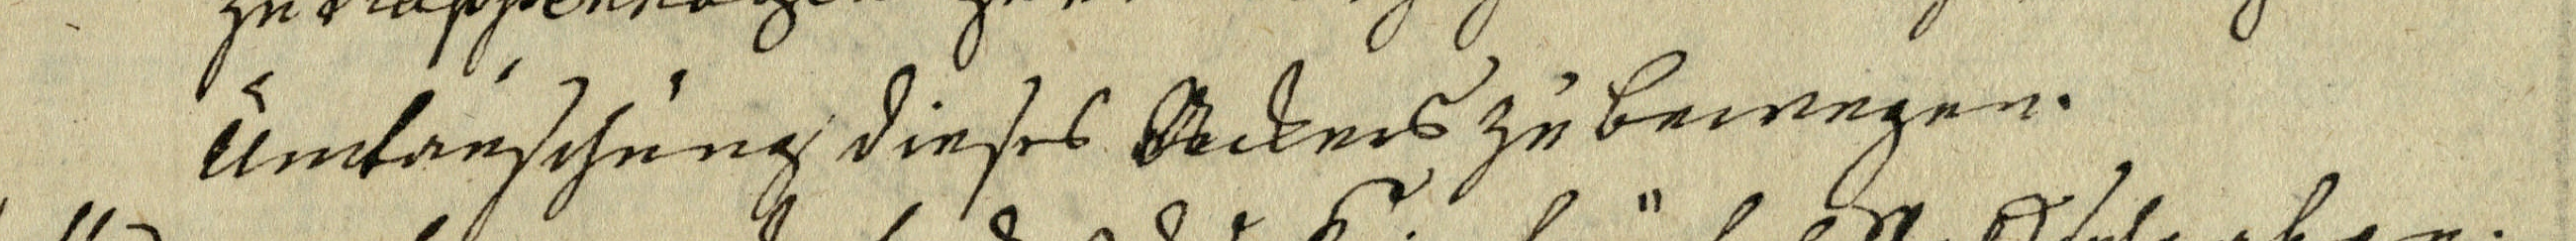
Umtauschung dieses Ackers zu bewegen.
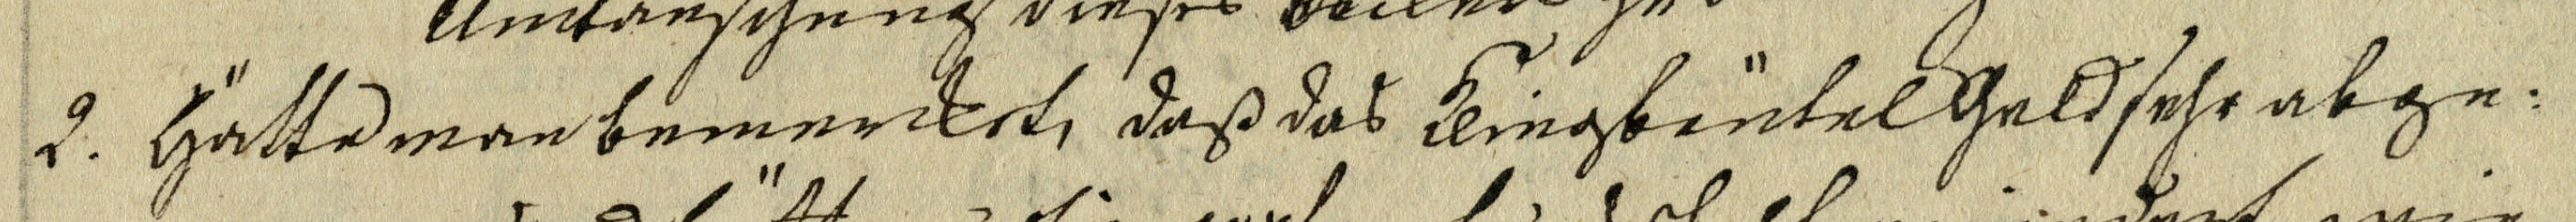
2. Hätte man bemercket, daß das Klingbeutel Geld sehr abge¬
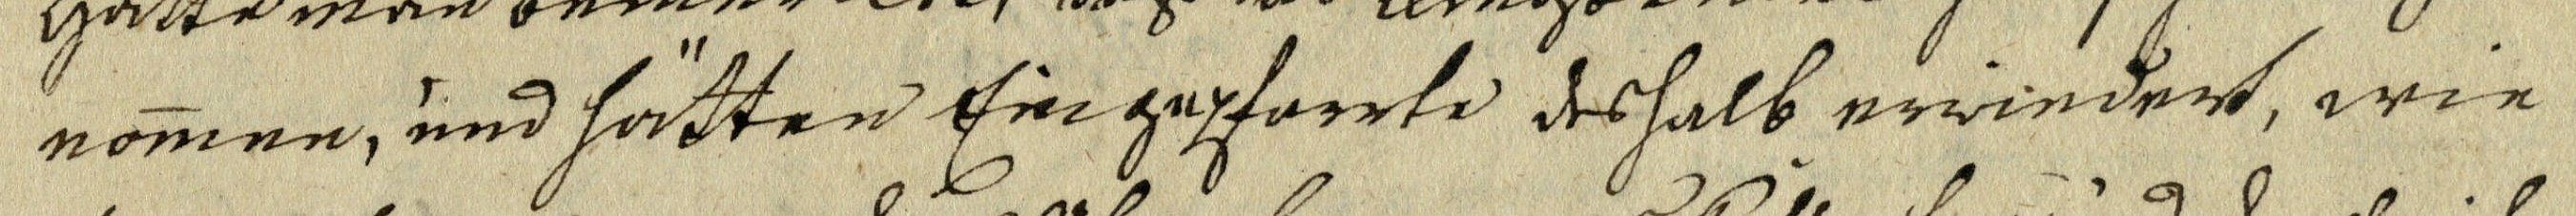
nomen, und hätten Eingepfarrte deshalb erwiedert, wie
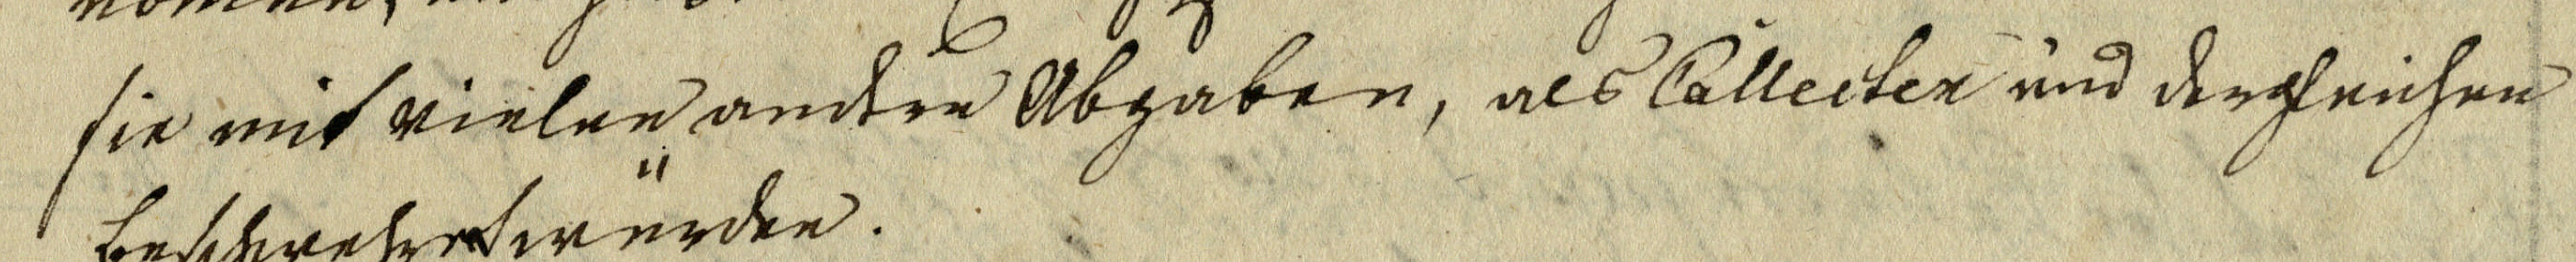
sie mit vielen andern Abgaben, als Collecten und dergleichen
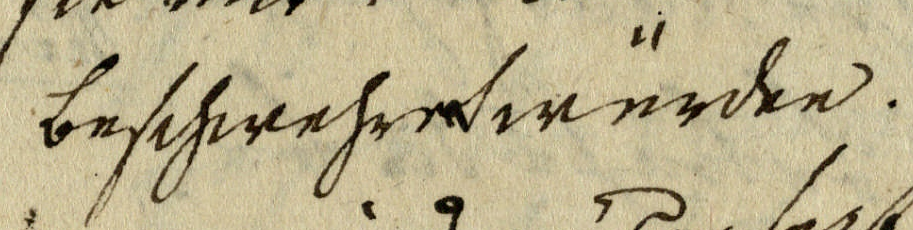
beschwehret würden.
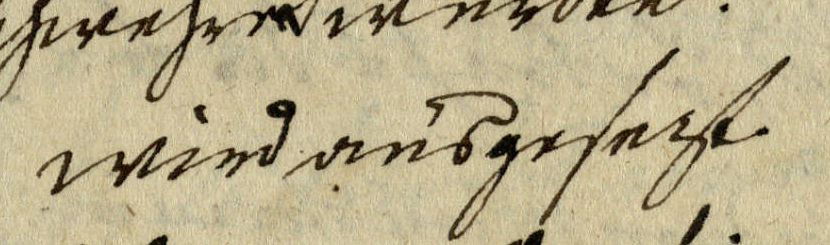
Wird ausgesezt.
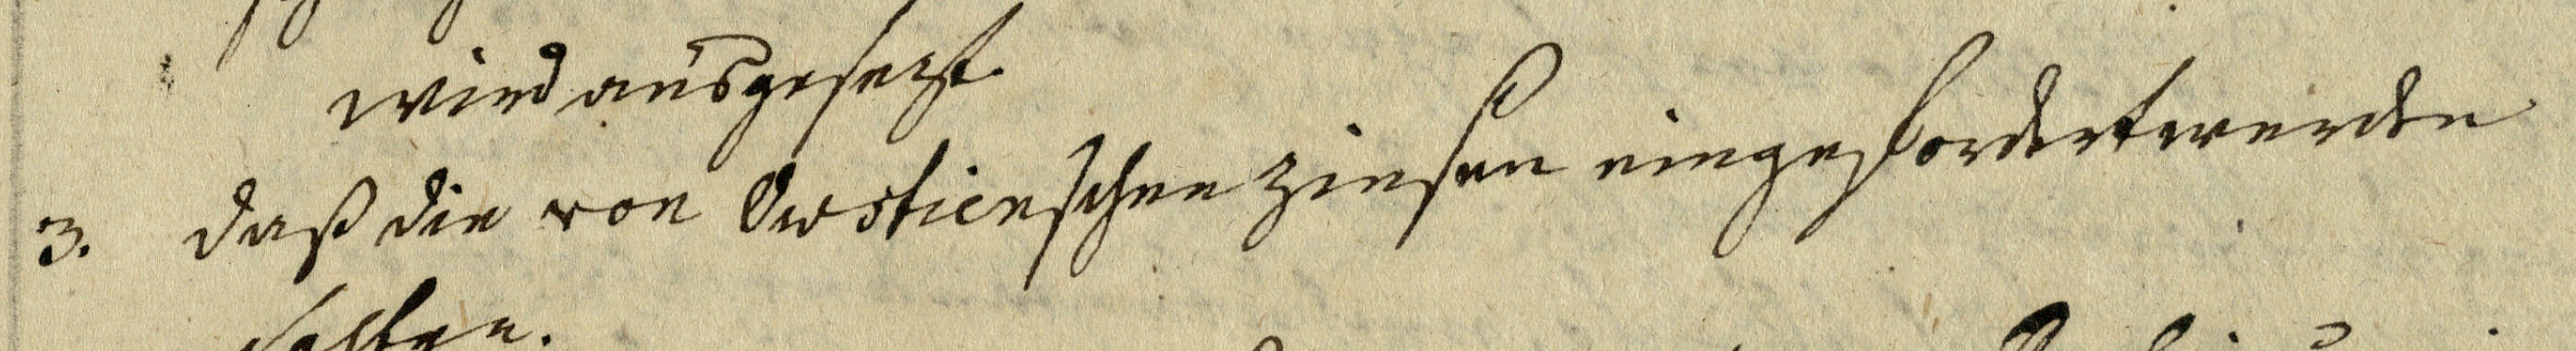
3. daß die die von Owstienschen Zinsen eingefordert werden
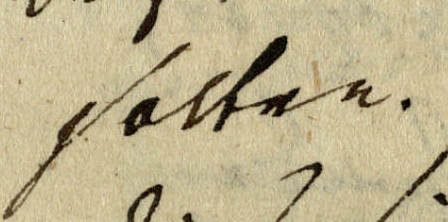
sollten.
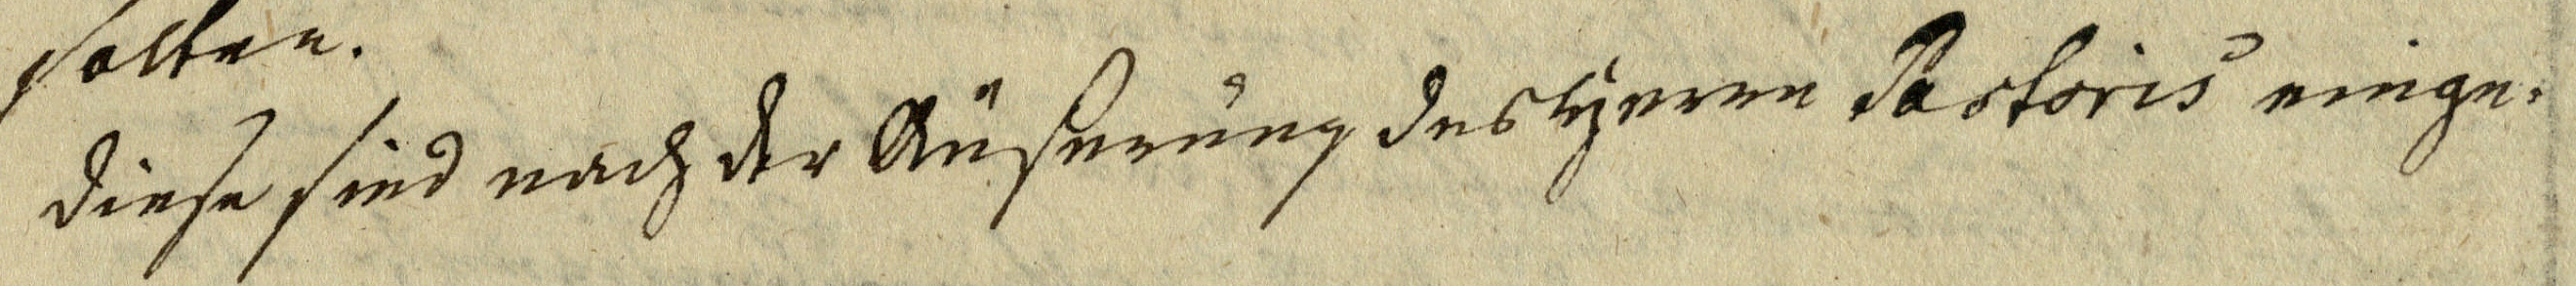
Diese sind nach der Äußerung des Herrn Pastoris einge¬
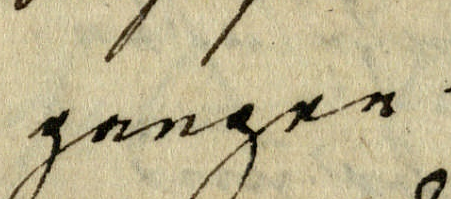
gangen.
